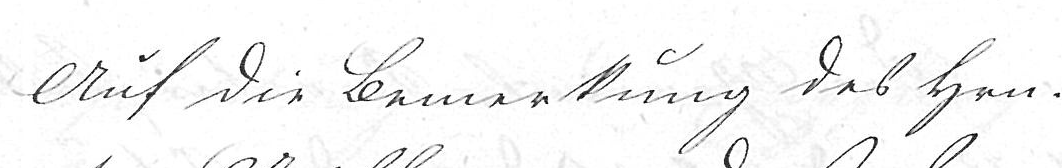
Auf die Bemerkung des Hrn.
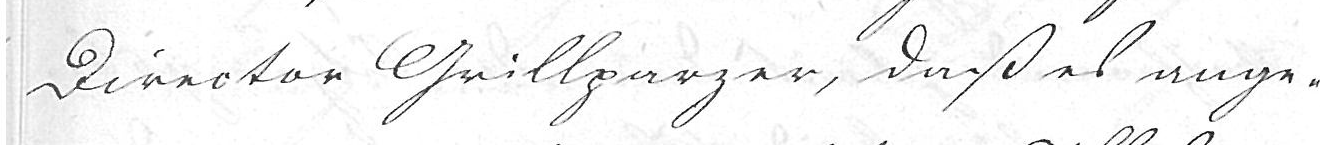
Director Grillparzer, daß es ange-
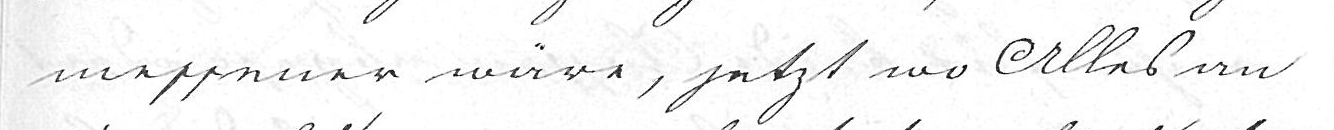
messener wäre, jetzt wo Alles an
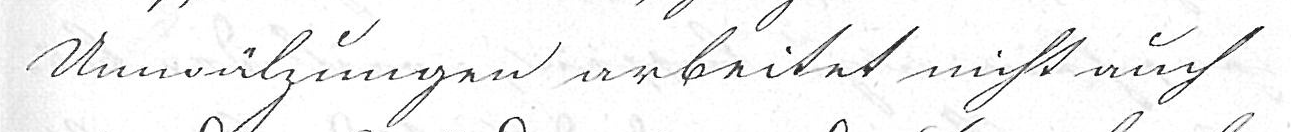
Umwälzungen arbeitet nicht auch
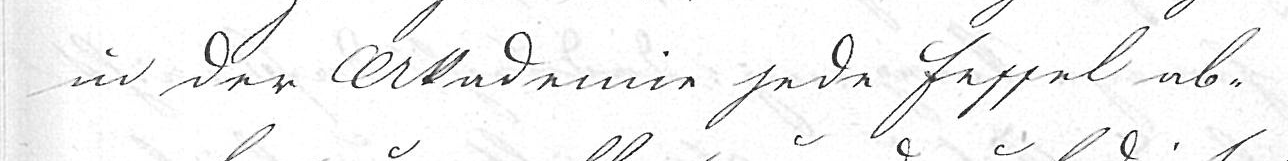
in der Akademie jede Fessel ab-
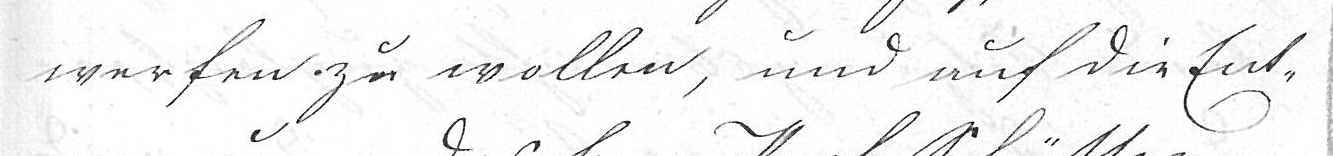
werfen zu wollen, und auch die Ent-
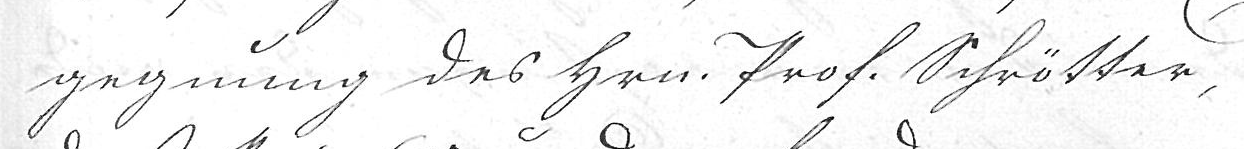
gegnung des Hrn. Prof. Schrötter,
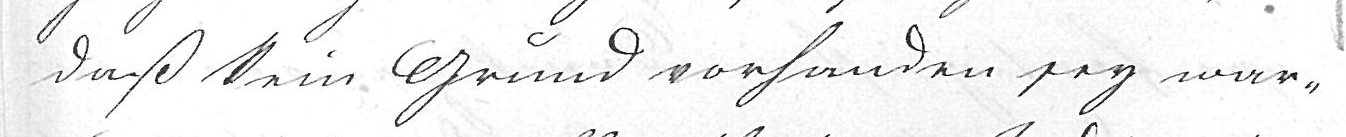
daß kein Grund vorhanden sey war-
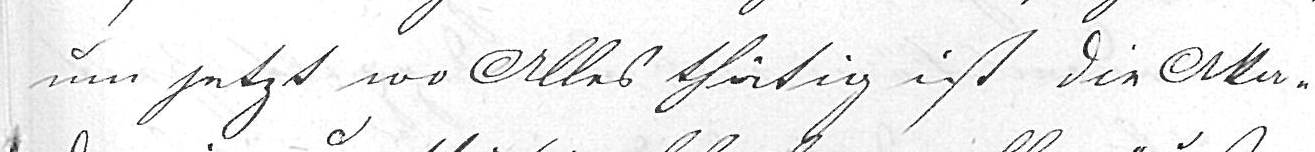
um jetzt wo Alles thätig ist die Aka-
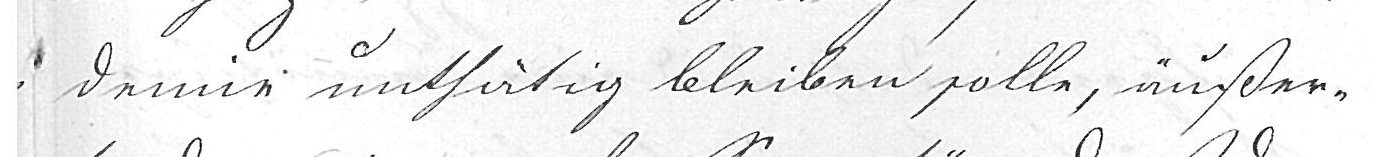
demie unthätig bleiben solle, äußer-
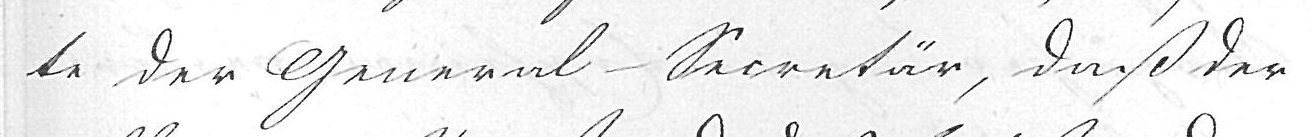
te der General-Secretär, daß der
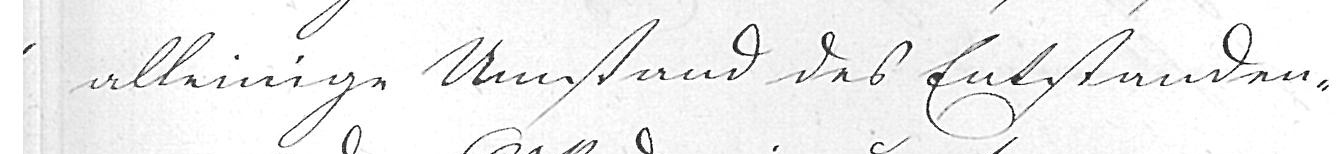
alleinge Umstand des Entstanden-
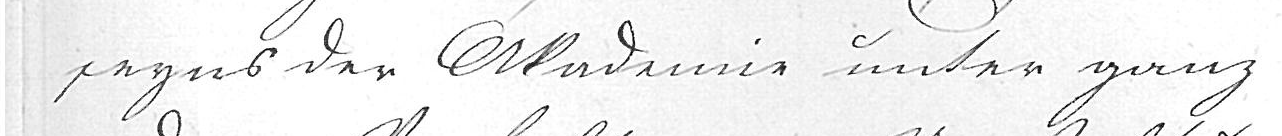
seyns der Akademie unter ganz
